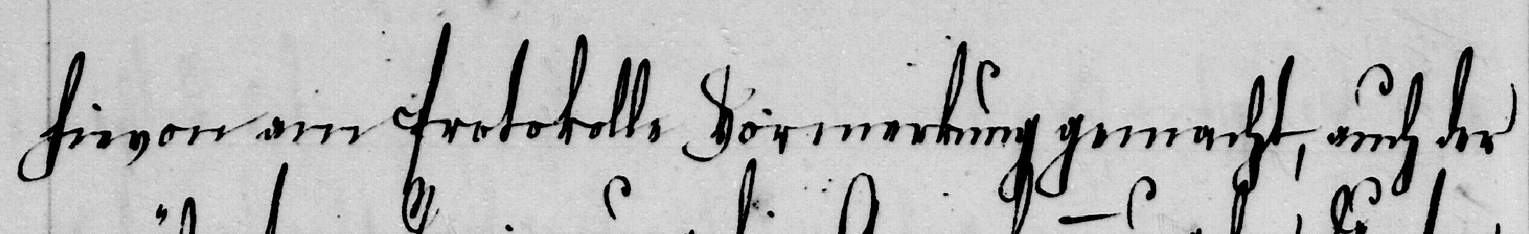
hievon am Protokolle Vormerkung gemacht, auch der
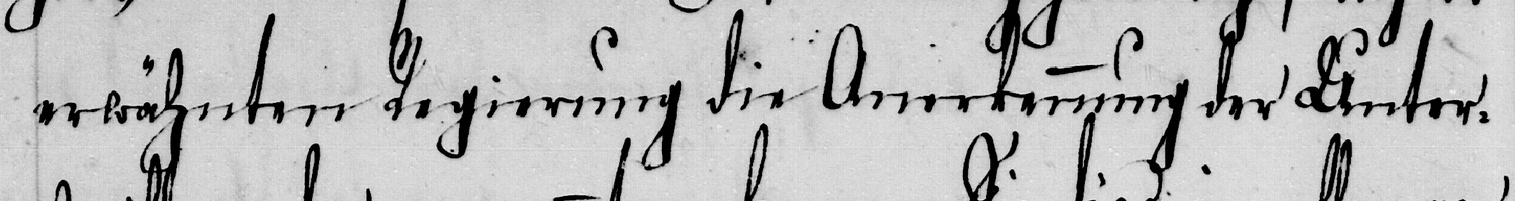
erwähnten Regierung die Anerkennung der Unter¬
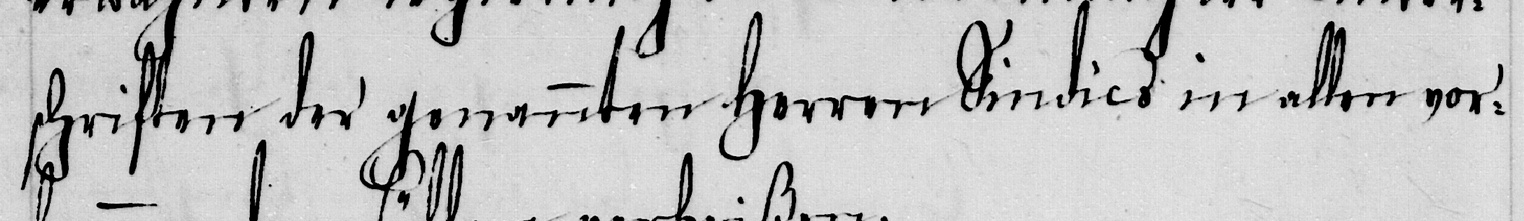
schriften der genannten Herren Sindics in allen vor¬
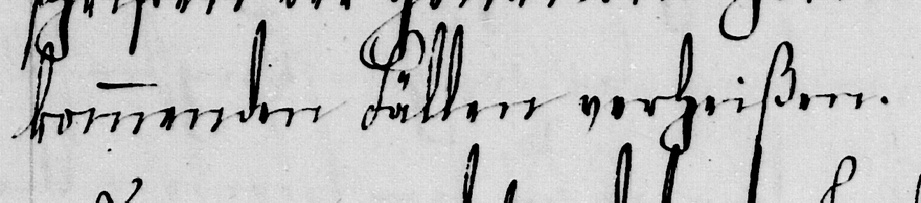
kommenden Fällen verheißen.
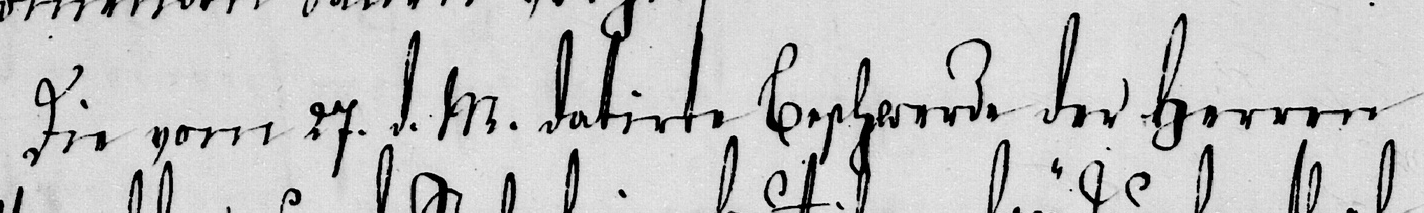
Die vom 27. d. M. datirte Beschwerde der Herren
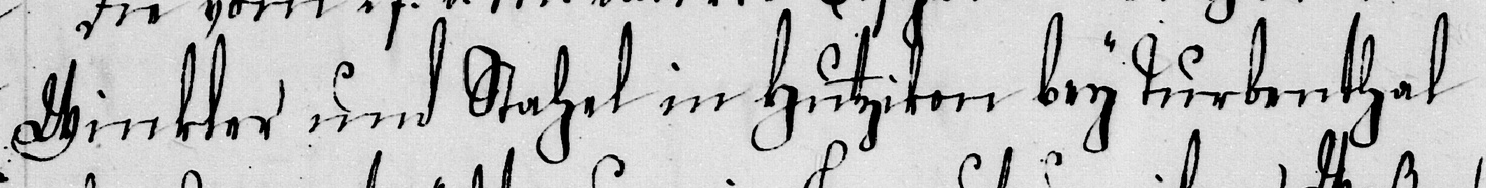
Winkler und Stahel in Hutzikon bey Turbenthal
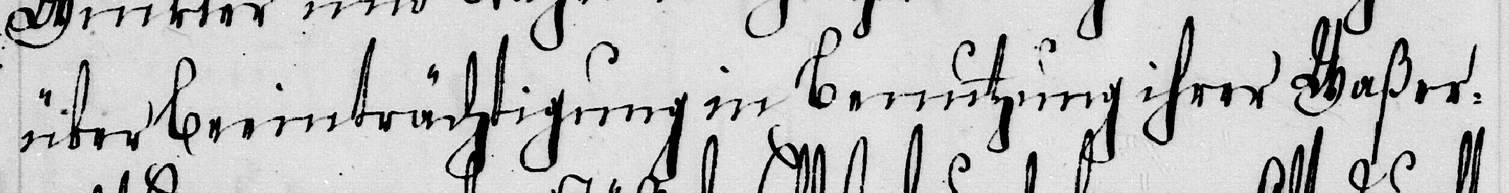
über Beeinträchtigung in Benutzung ihrer Waßer¬
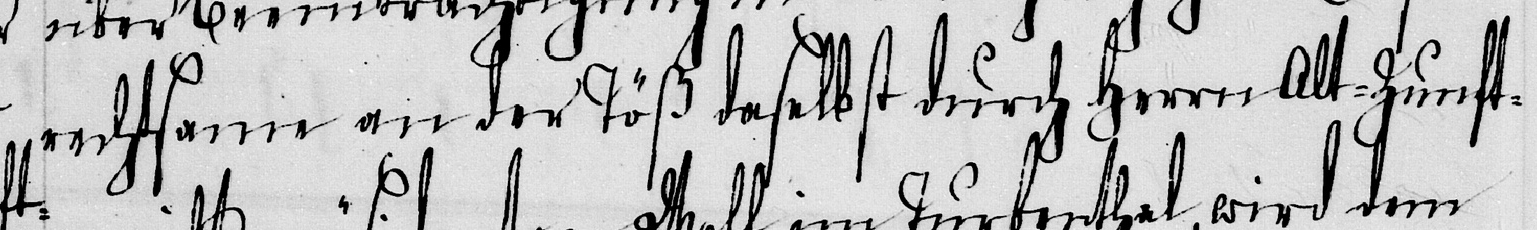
rechtsame an der Töß daselbst durch Herrn Alt-Zunft¬
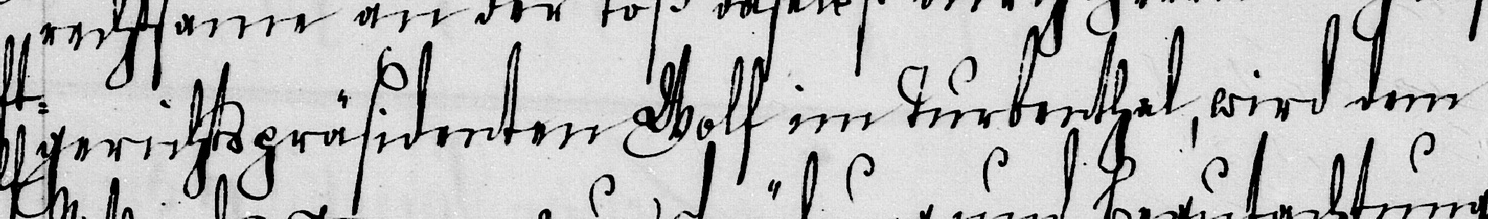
gerichtspräsidenten Wolf im Turbenthal, wird dem
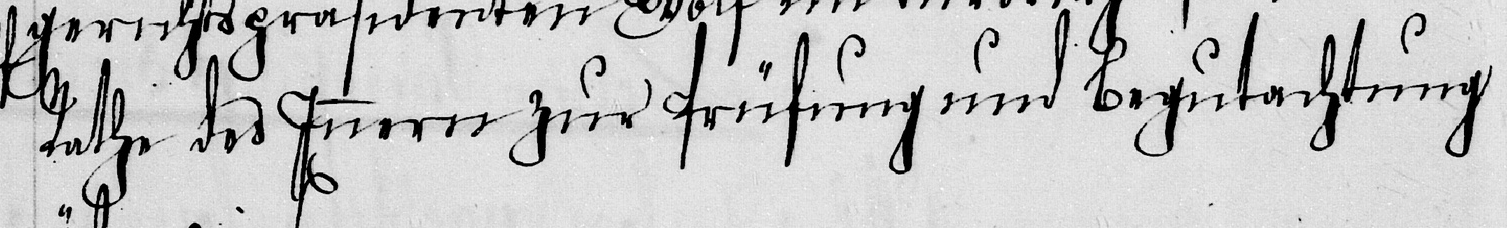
Rathe des Innern zur Prüfung und Begutachtung
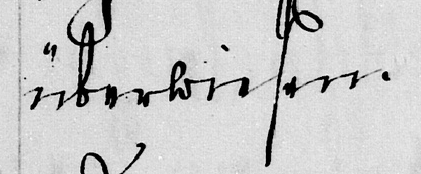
überwiesen.
